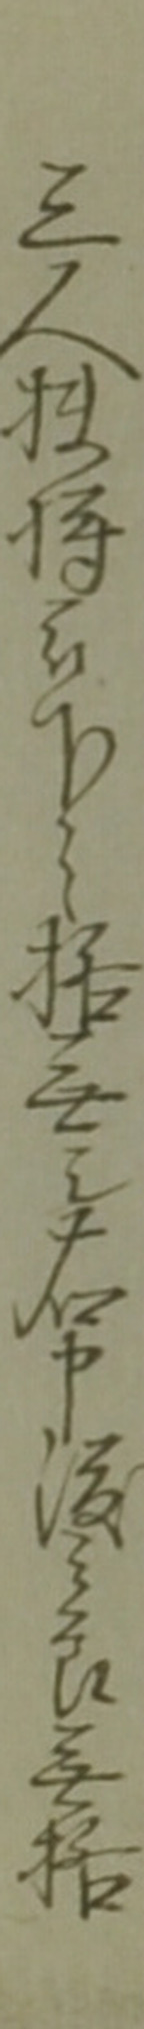三人扶持被下之格無シ右申渡之節無格
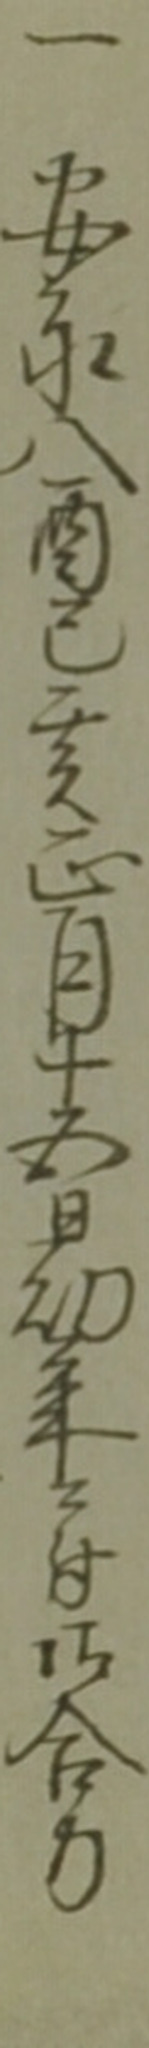一安永八酉己亥正月十五日幼年ニ付御合力
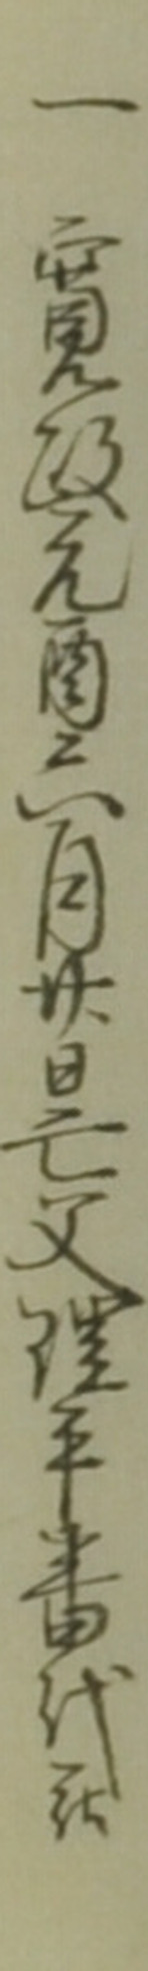一寛政元酉六月廿日亡父理平番代被
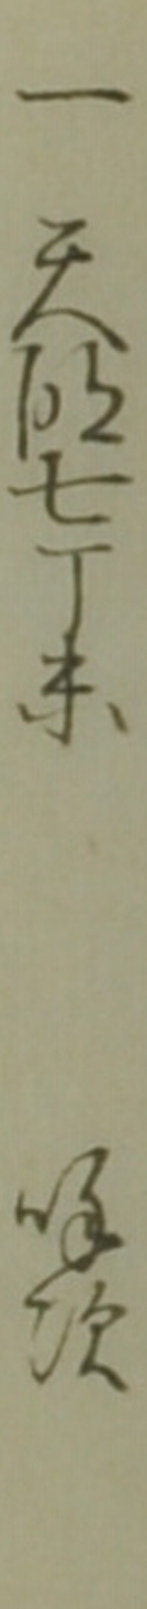一天明七丁未呼次

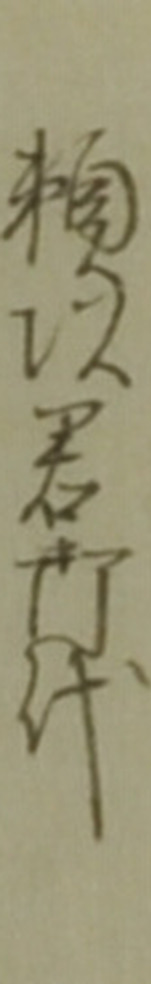頼以君御代
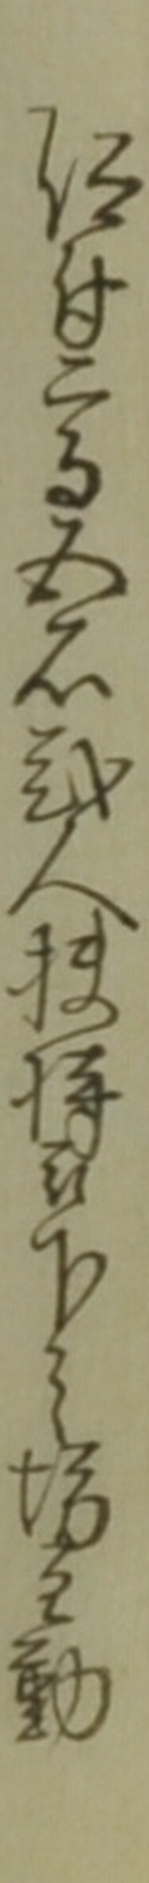仰付高五石弐人扶持被下之坊主勤
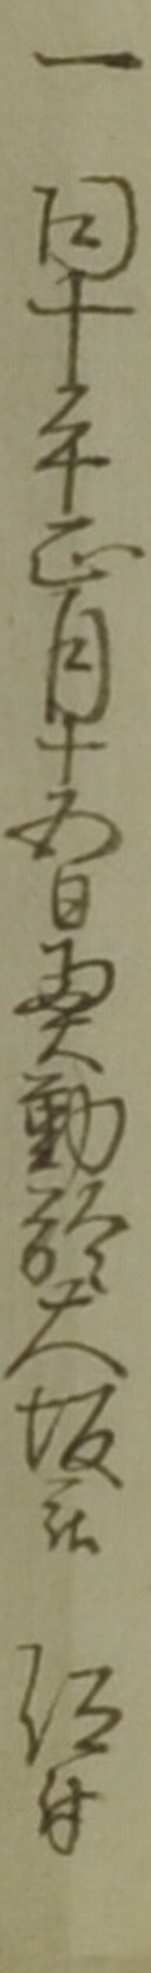一同十午正月十五日奥勤於大坂被仰付
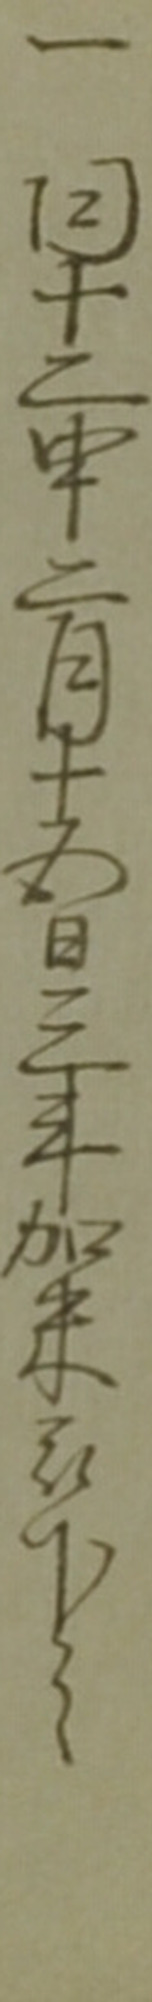一同十二申二月十五日三斗加米被下之
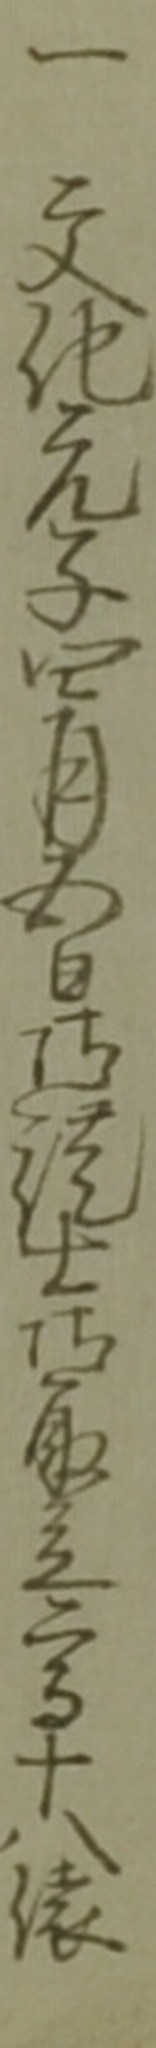一文化元子四月五日御徒士御取立高十八俵
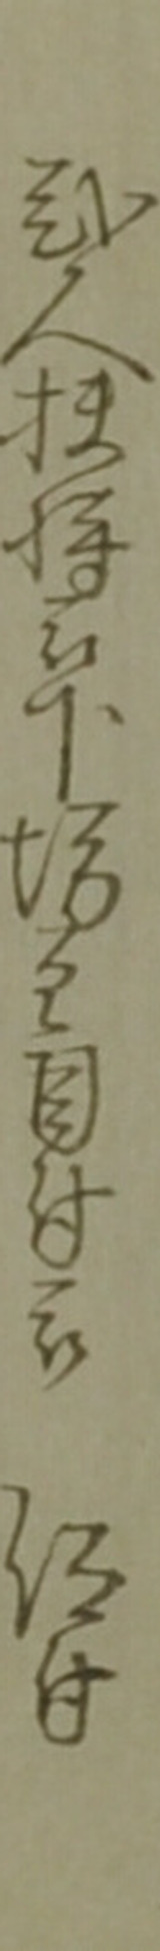弐人扶持被下坊主目付被仰付
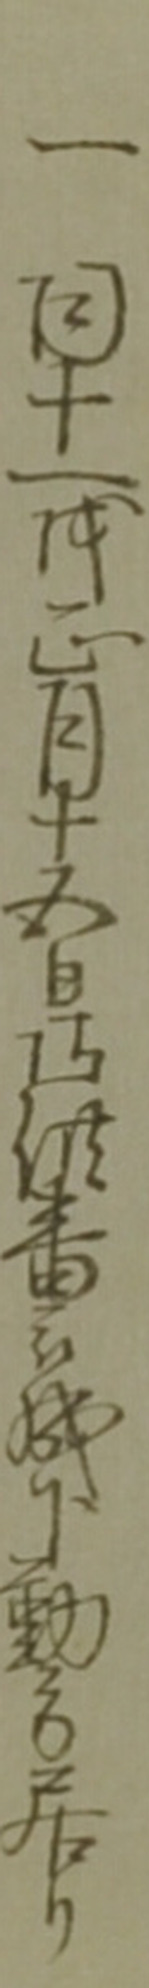一同十一戌正月十五日御供番被成下勤方居リ
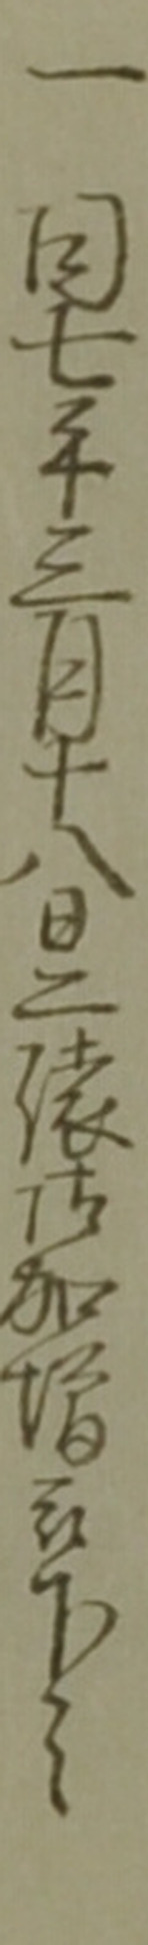一同七午三月十八日二俵御加増被下之
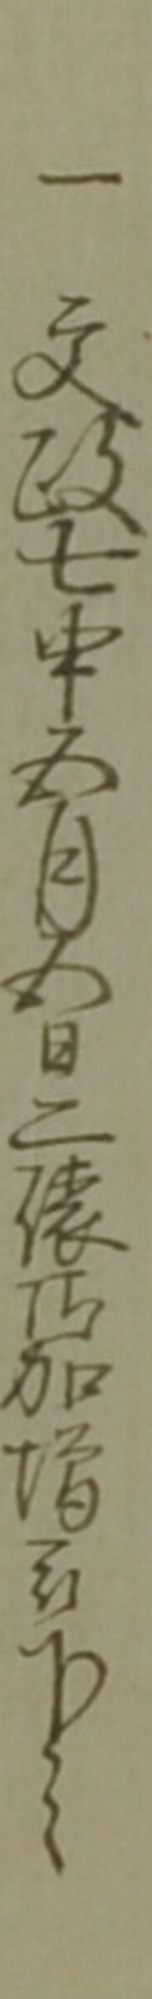一文政七申五月五日二俵御加増被下之
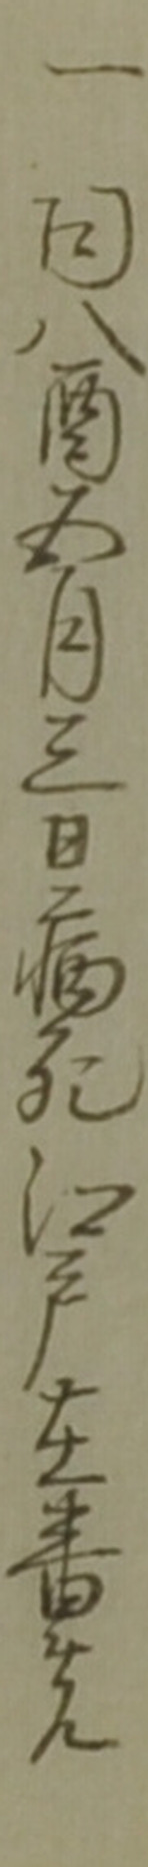一同八酉五月三日病死江戸在番先
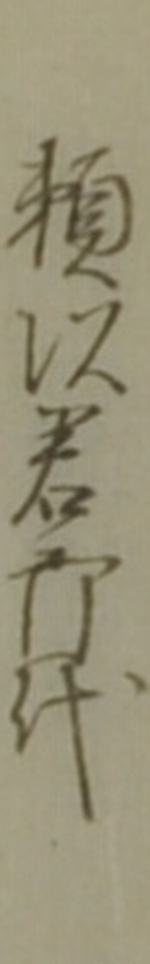頼以君御代
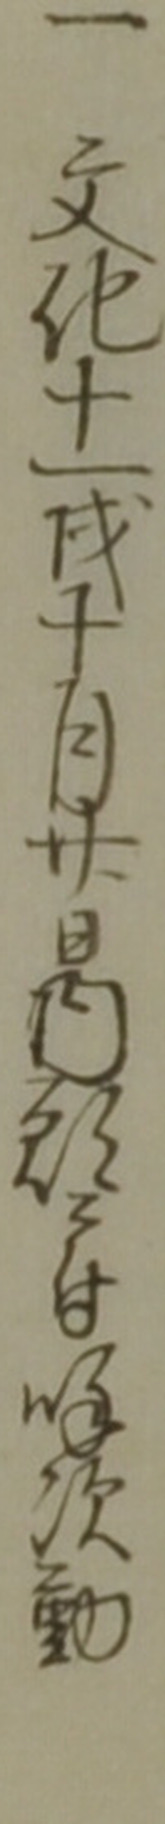一文化十一戌十月廿日内願ニ付呼次勤
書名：無足諸士勤仕録（五）
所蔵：伊那市立高遠町図書館・合同会社AMANE
